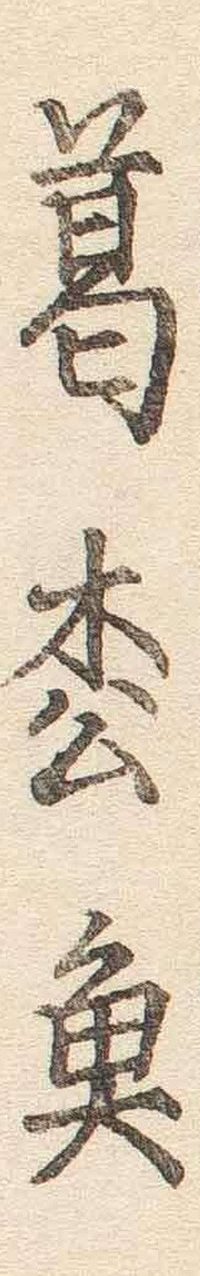葛松魚
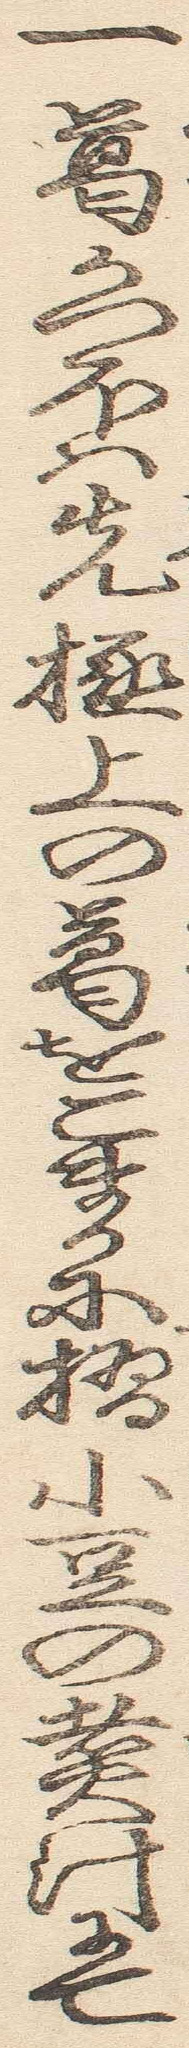葛かつほは先極上の葛をこまかに摺小豆の煮汁にて
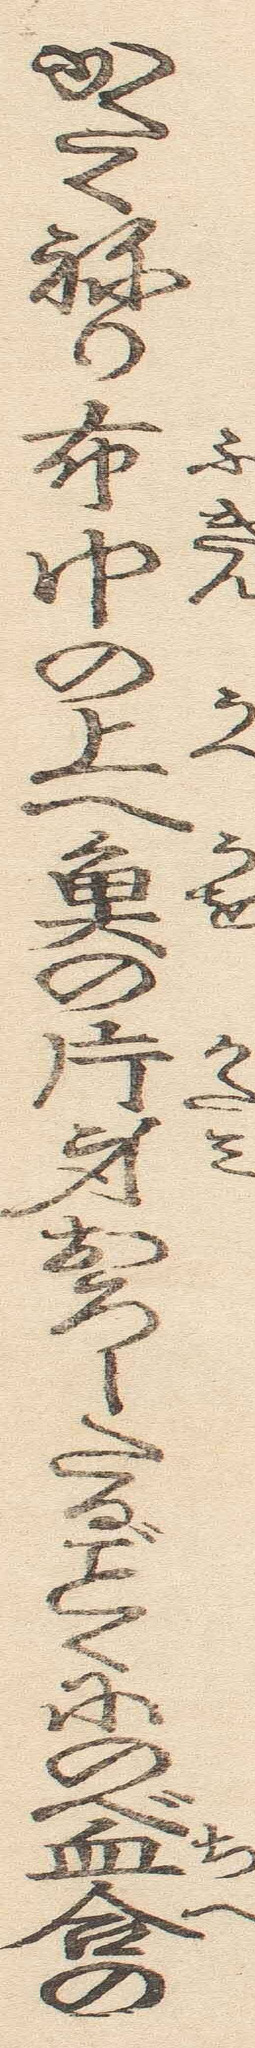かたくねり布巾の上へ魚の片身おろしたるごとくにのべ血合の

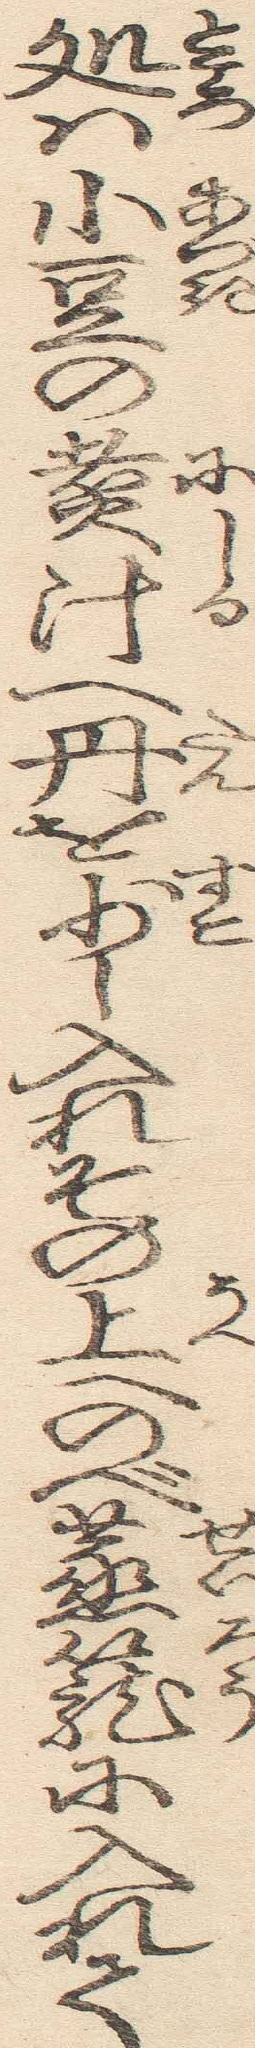処は小豆の煮汁へ丹を少し入れてその上へのべ蒸籠に入れて
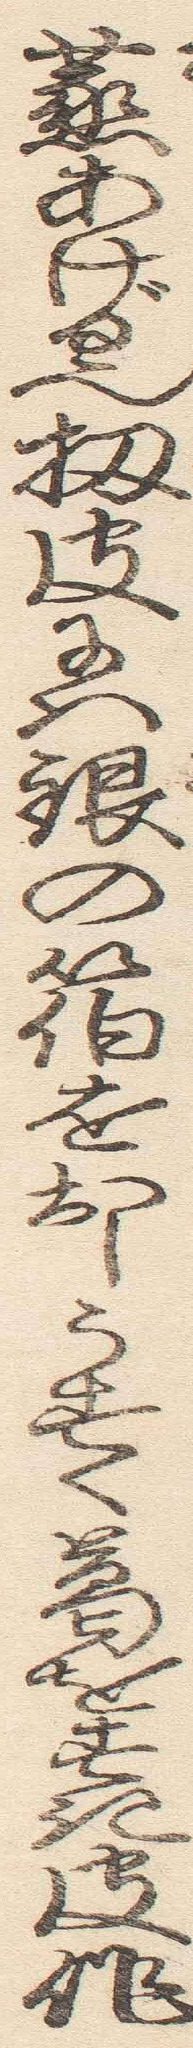蒸あげる也扨皮には銀の箔をおしうすく葛をすき皮作
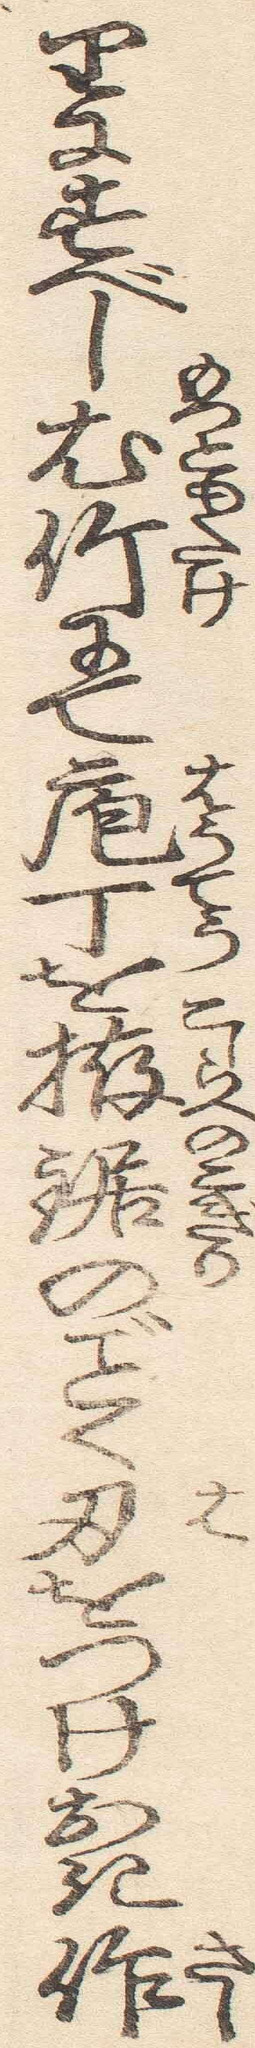りにすべし尤竹にて庖丁を拵鋸のごとく刃をつけおき作
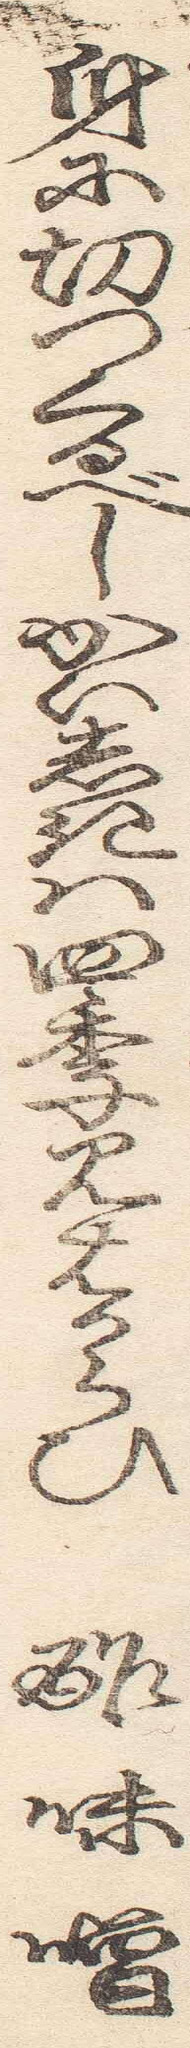身に切つくるべしかいしきは四季もはからひ酢味噌
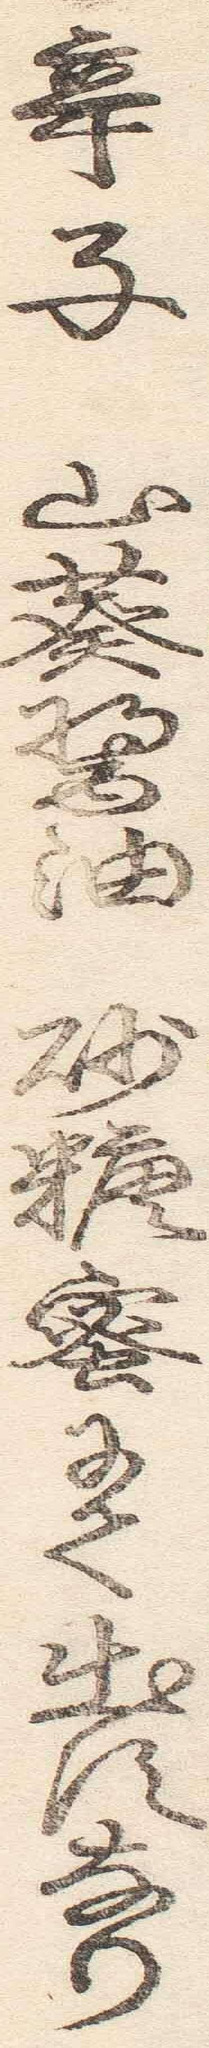辛子山葵醤油砂糖蜜にて出すなり
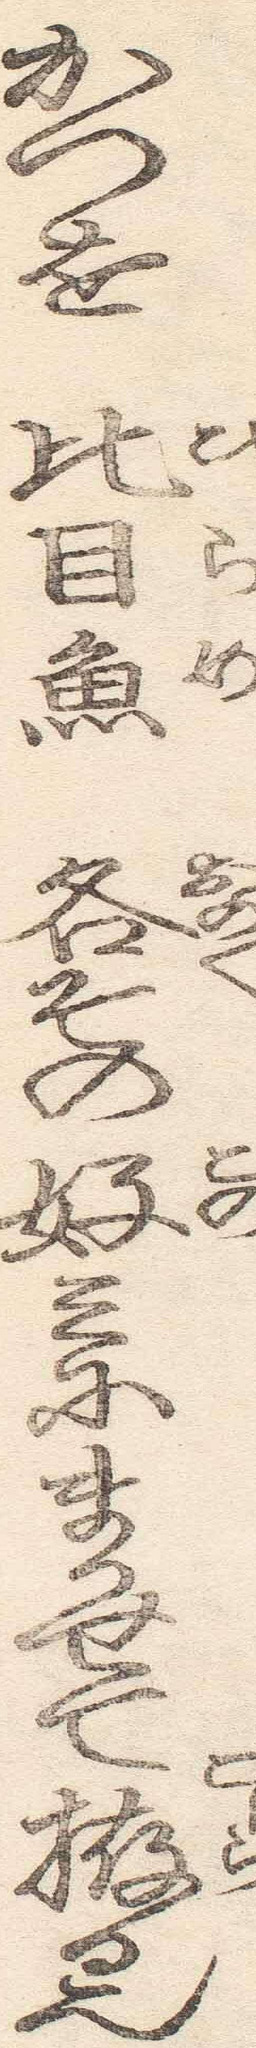かつを比目魚各その好みにまかせて拵る也
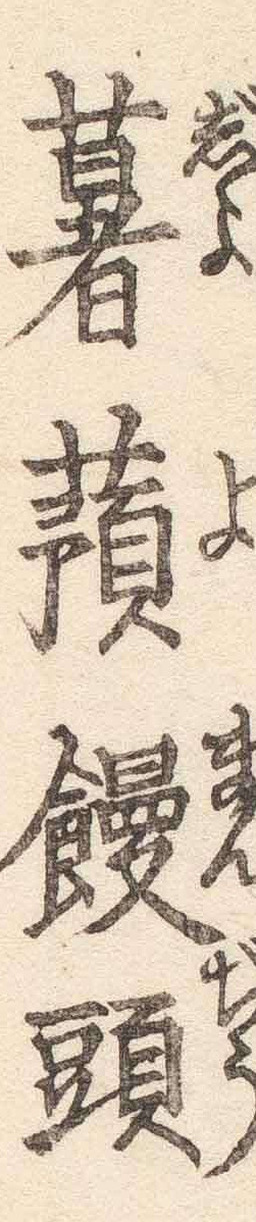薯蕷饅頭
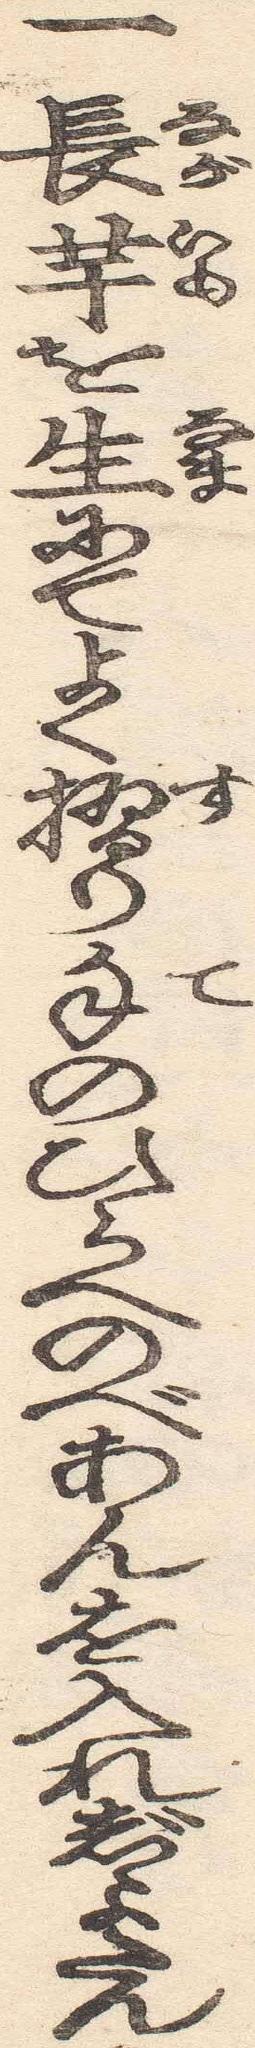一長芋を生にてよく摺り手のひらへのべあんを入れじよたん
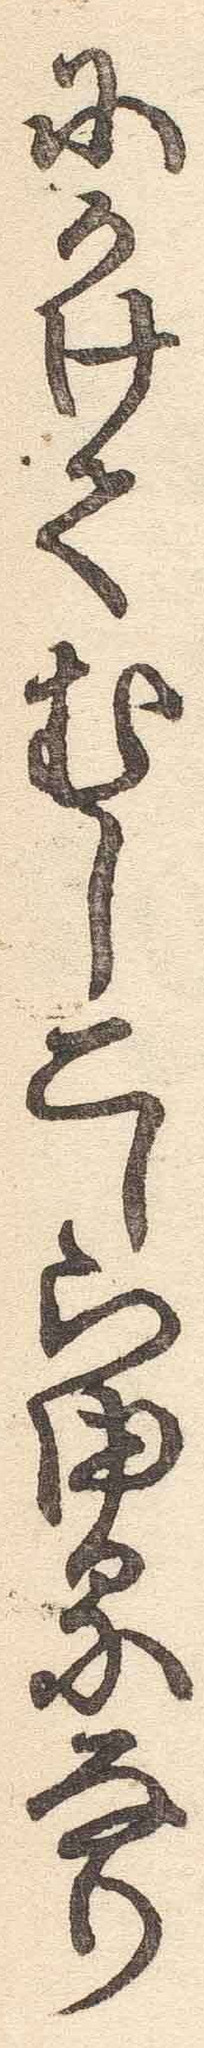にかけてむしこしらゆるになり
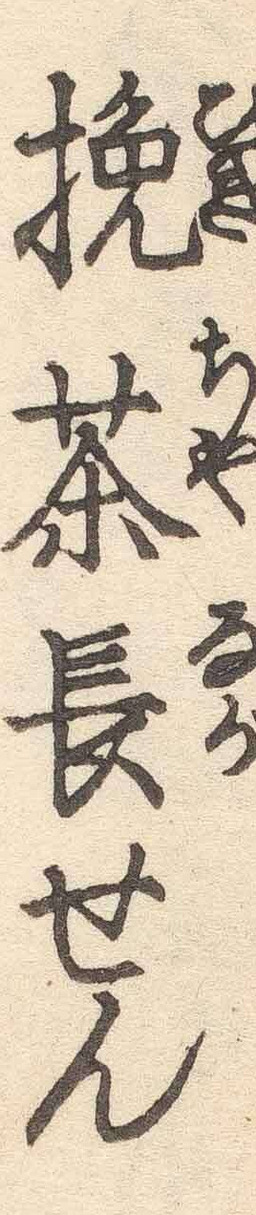挽茶長せん
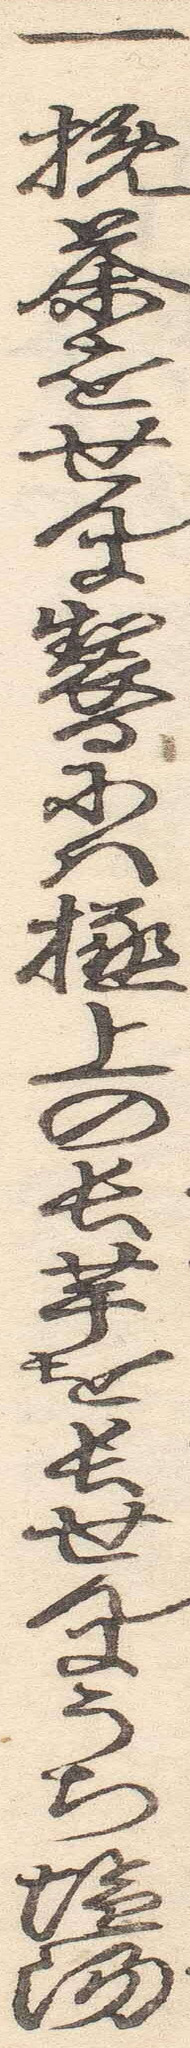一挽茶をせんに製るには極上の長芋を長せんにうち塩湯
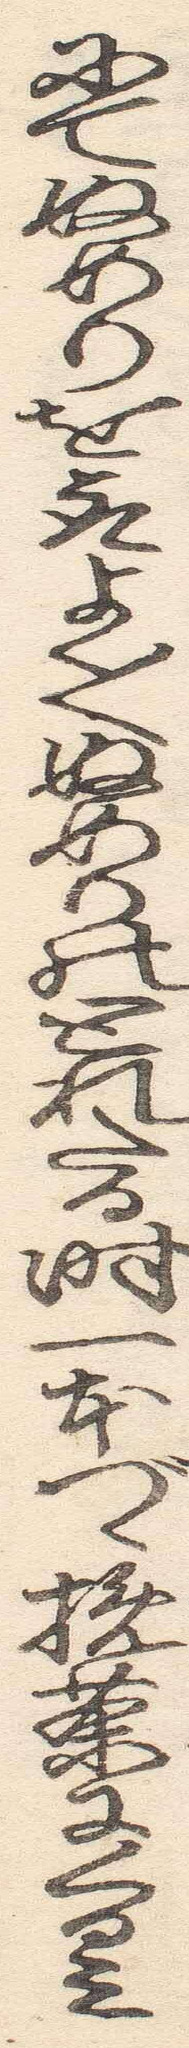にてぬめりを取よく〳〵ぬめりのとれたる時一本づヽ挽茶にくるみ
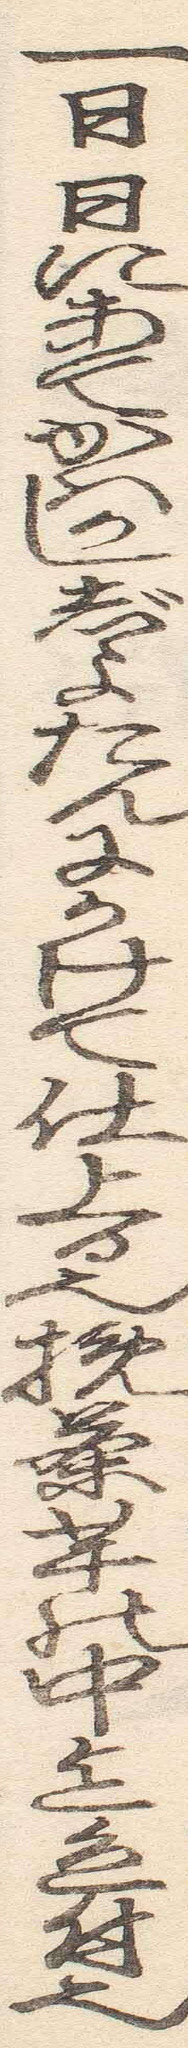一日日にあてかはかしじよたんにかけて仕上る也挽茶芋の中迄色付也
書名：料理通
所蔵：東京学芸大学附属図書館 国文学研究資料館
